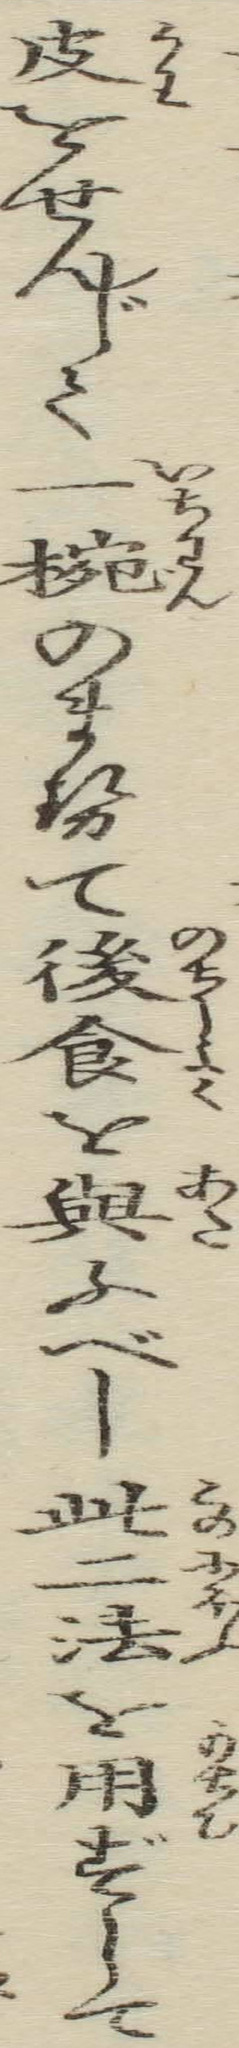皮をせんじて一椀のませて後食を与ふべし此二法を用ずして
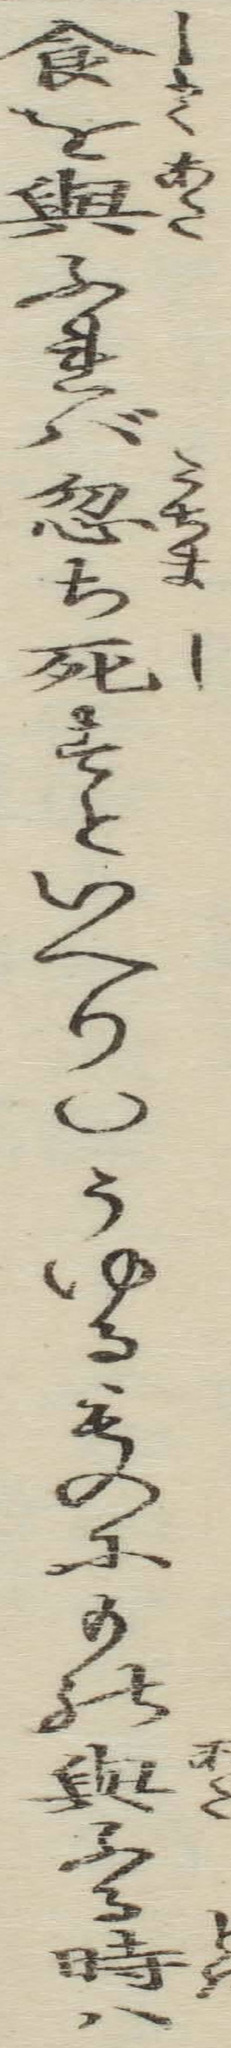食を与ふれば忽ち死すといへり○うゆるものにもの与ふる時は
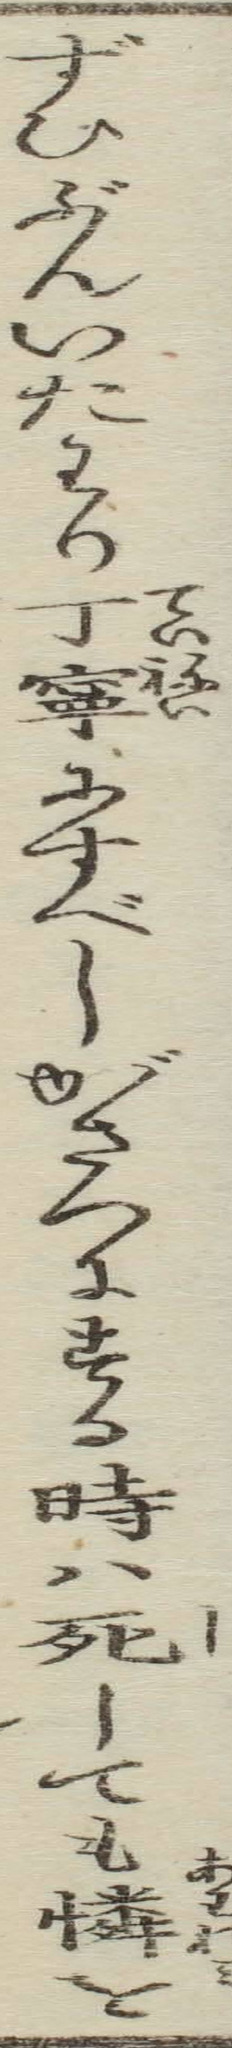ずひぶんいたわり丁寧にすべしがさつにする時は死しても憐を
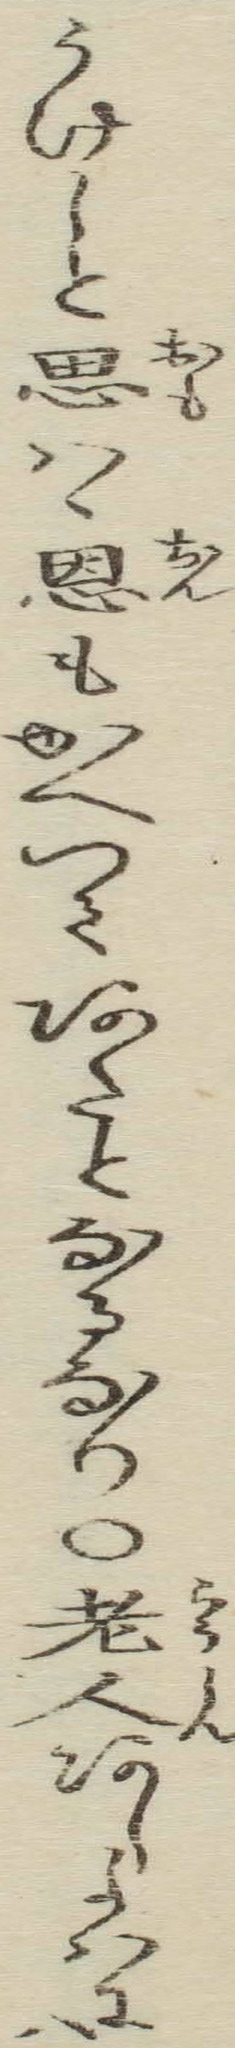うけしと思はゝ恩もかへつてあたとなるなり○老人あしよはには
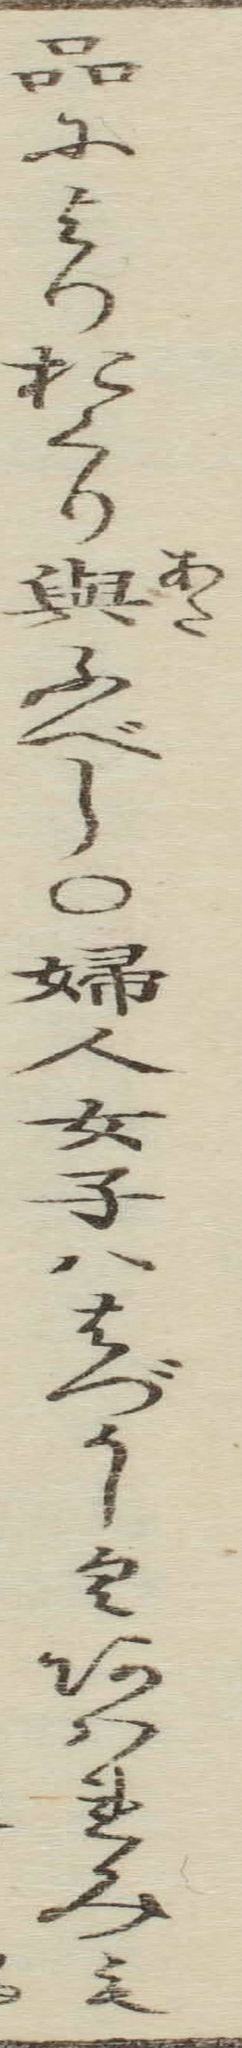品によりおくり与ふべし○婦人女子ははづかしくあはれみも
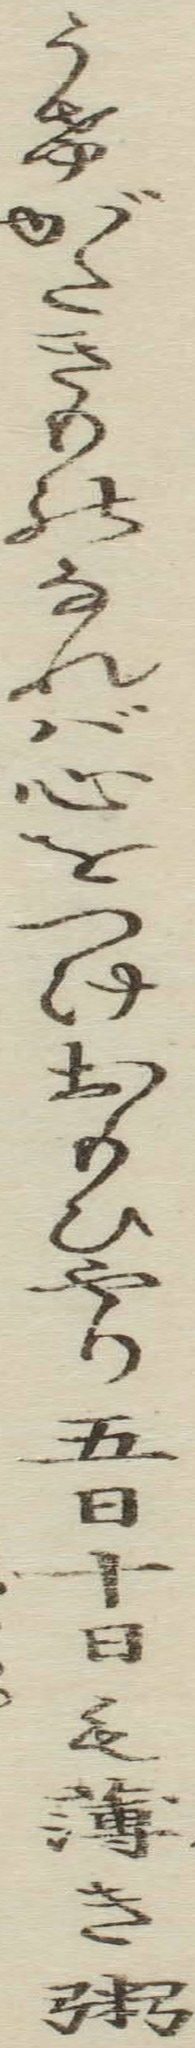うけがたきものなれば心をつけおもひやり五日十日も薄き粥
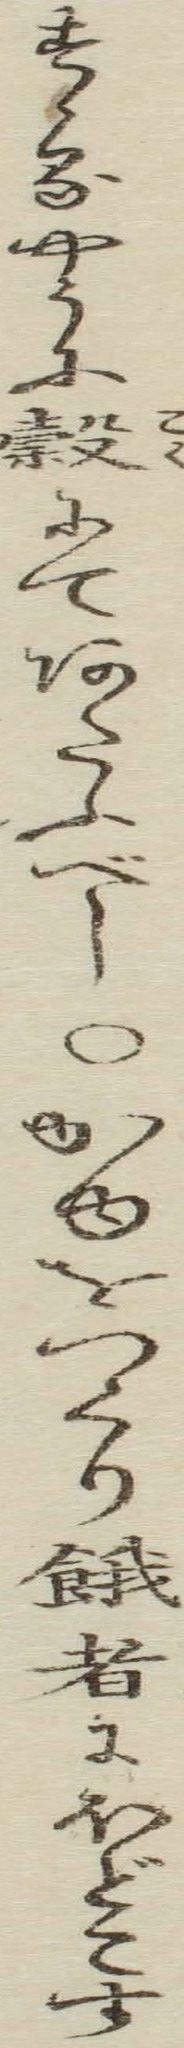すゝるやうに穀にてあたふべし○かゆをつくり餓者にほどこす
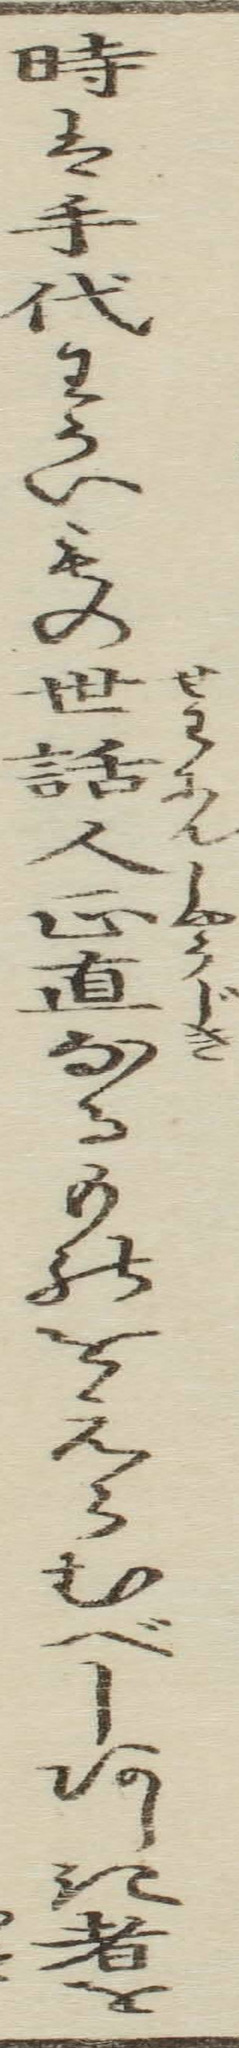時は手代わかいもの世話人正直なるものをえらむべしあしき者を
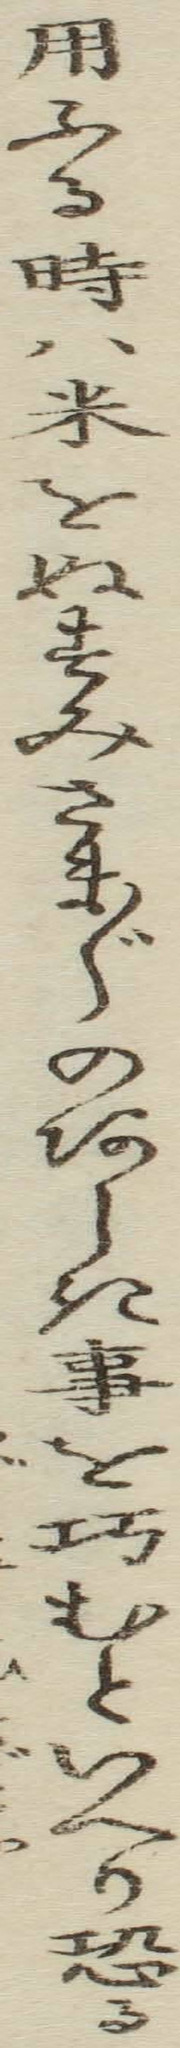用ふる時は米をぬすみさま〴〵のあしき事を巧むといへり恐る
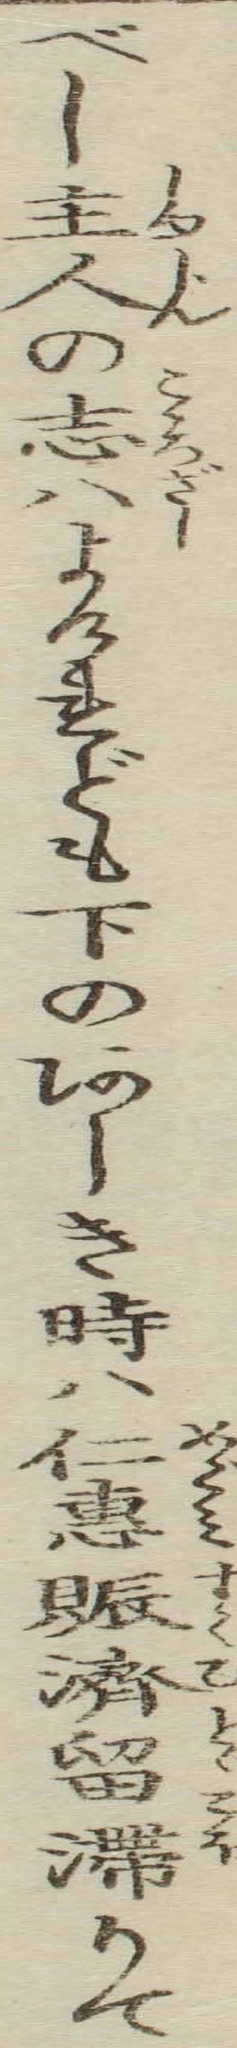べし主人の志はよけれども下のあしき時は仁恵賑濟留滞りて

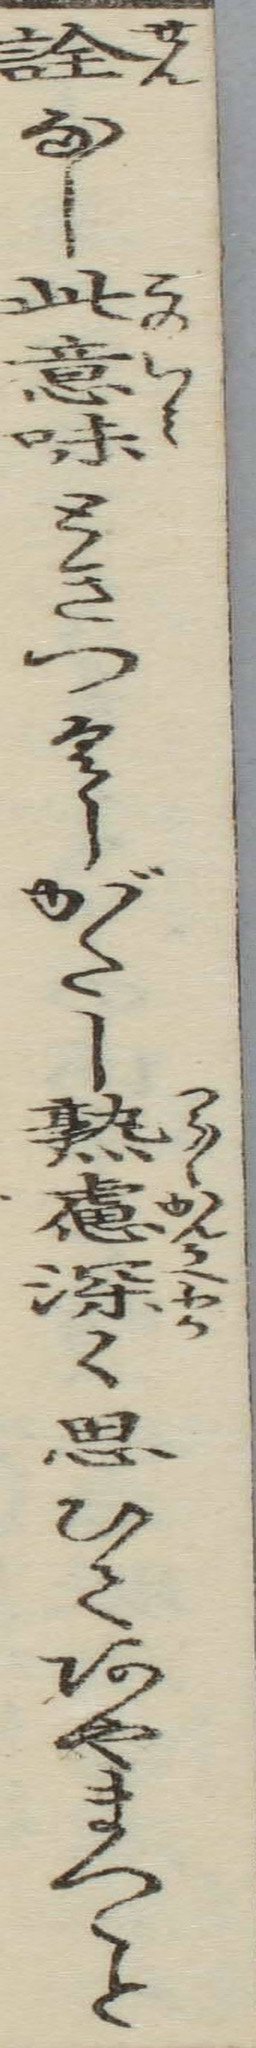詮なし此意味ときつくしがたし熟慮深く思ひてあやまつこと
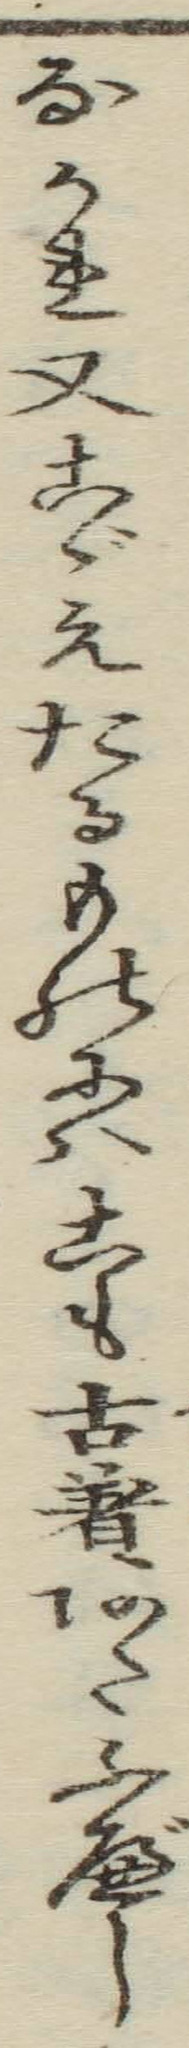なかれ又こゞえたるものにはこも古着あたふべし
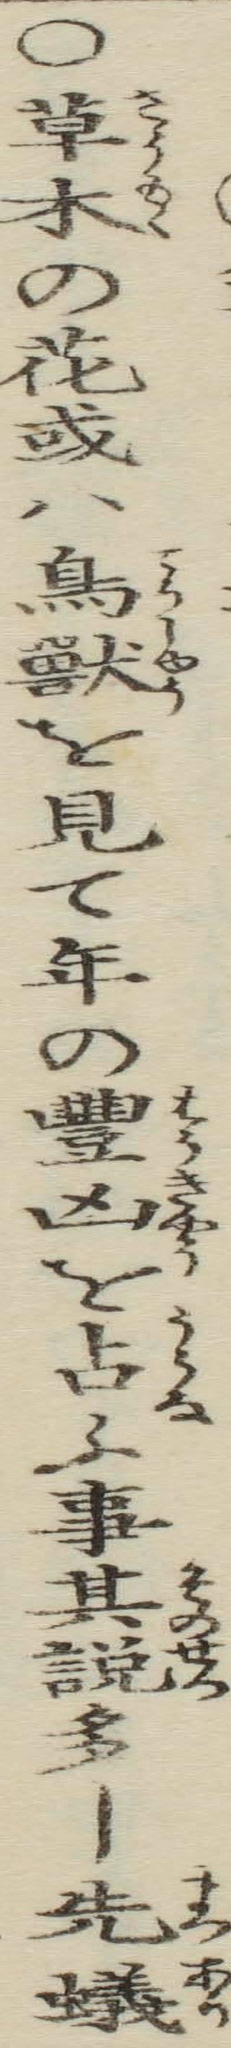○草木の花或は鳥獣を見て年の豊凶を占ふ事其説多し先蟻
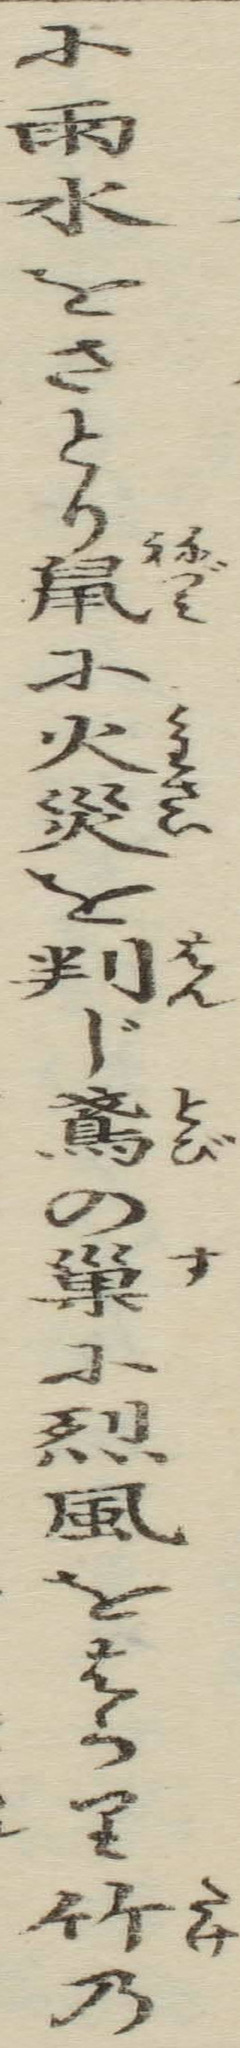に雨水をさとり鼠に火災を判じ鳶の巣に烈風をはかり竹の
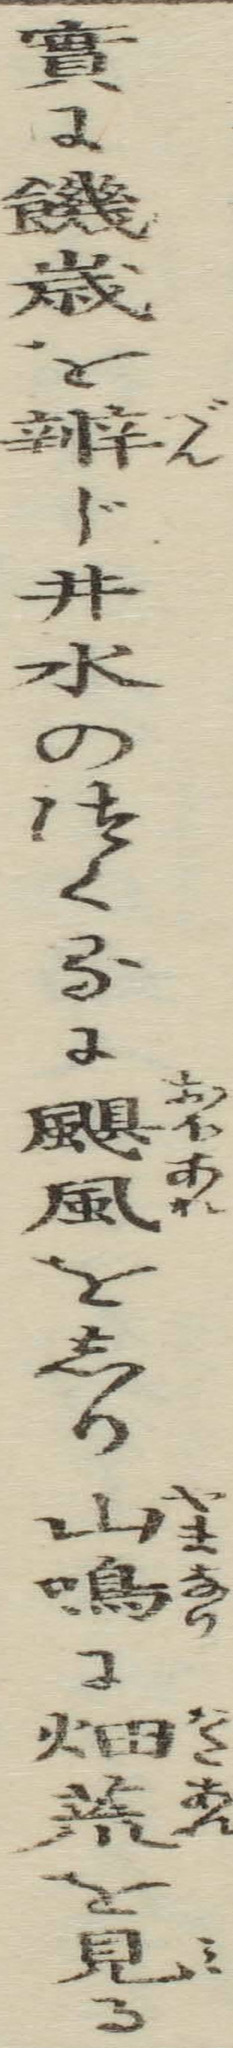實に饑歳を弁じ井水のつくるに颶風をしり山鳴に畑荒を見る
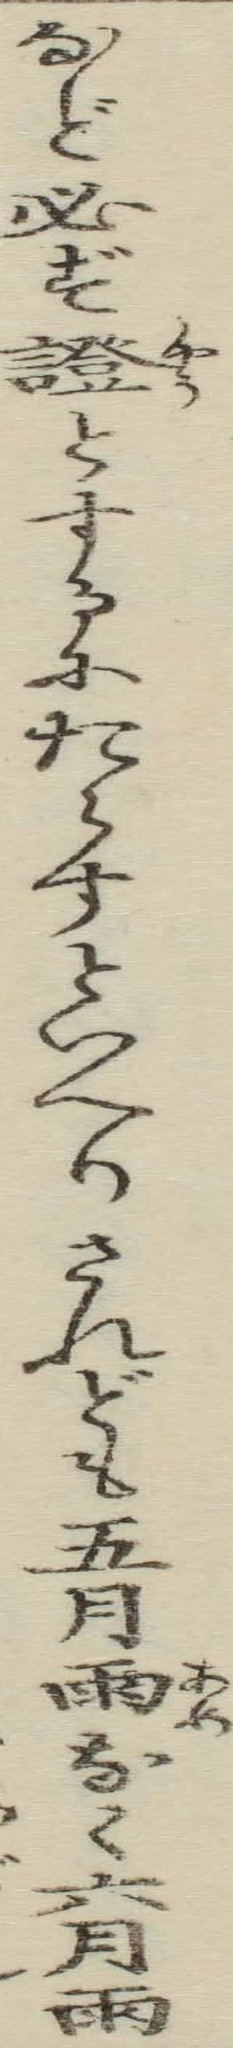など必ず證とするにたらすといへりされども五月雨なく六月雨
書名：救荒便覧
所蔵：国文学研究資料館
